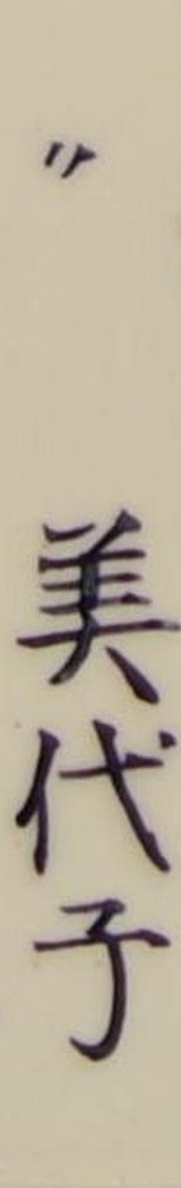美代子
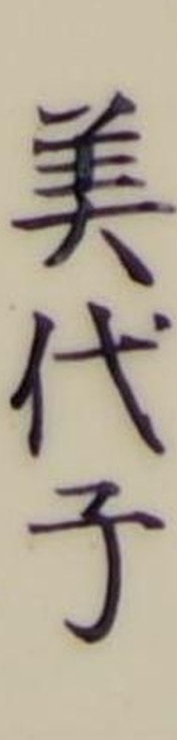美代子
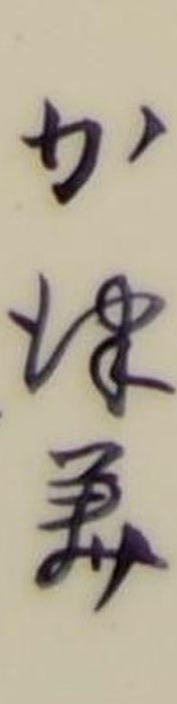かつみ

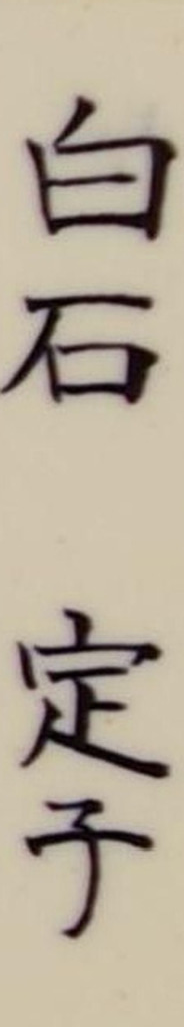白石定子
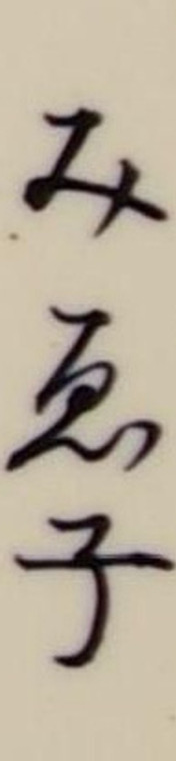みゑ子
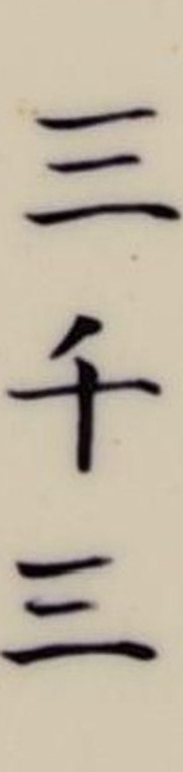三千三
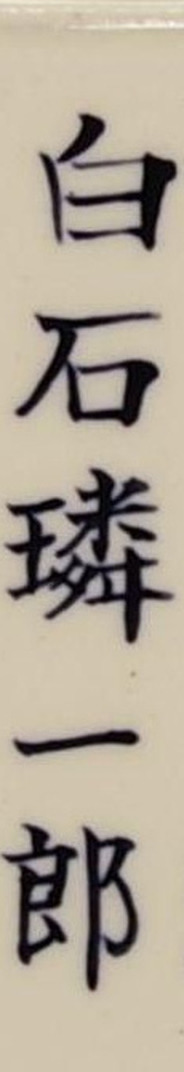白石璘一郎
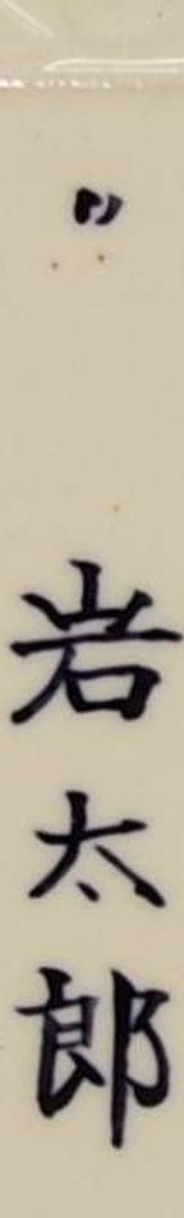岩太郎
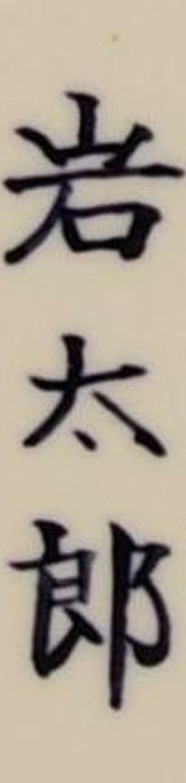岩太郎
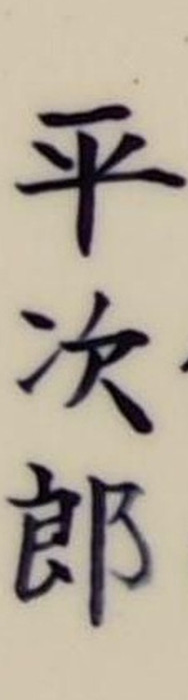平次郎
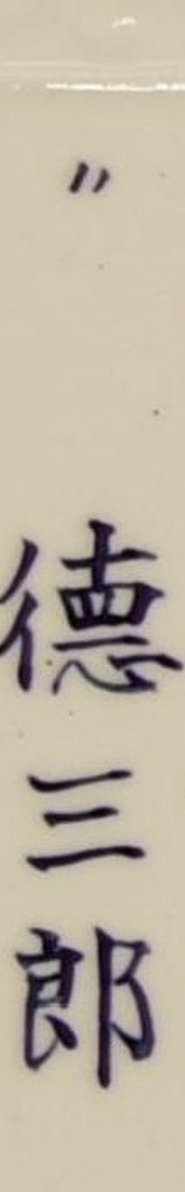徳三郎
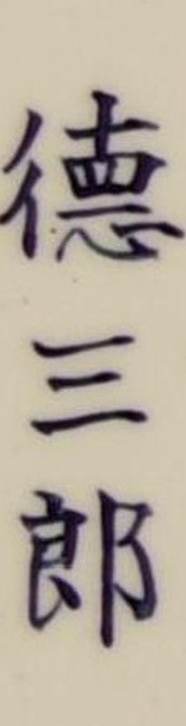徳三郎
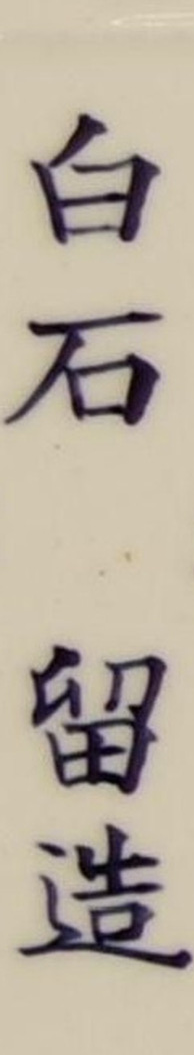白石留造
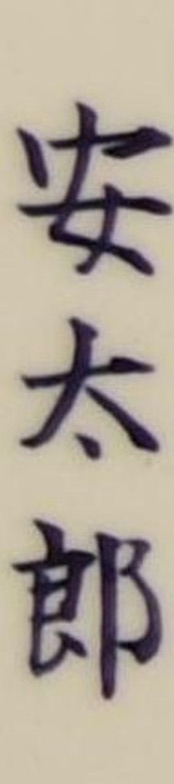安太郎

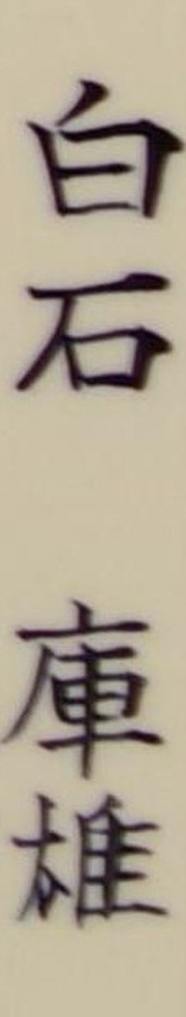白石庫雄
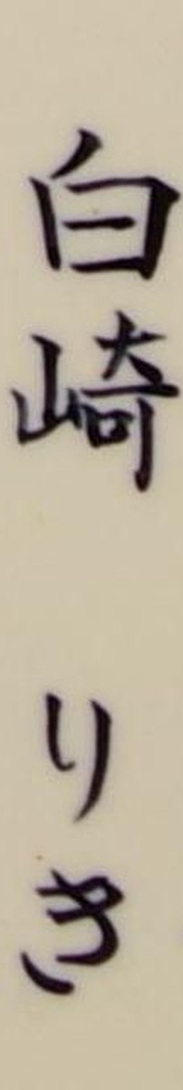白崎りき
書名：A~D
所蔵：koyasan kongobuji
